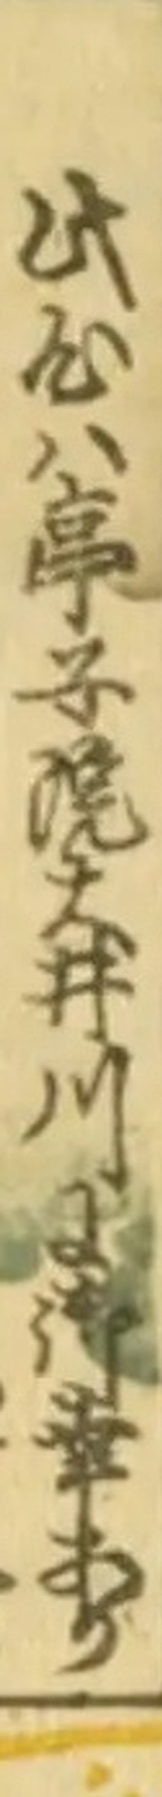此心は亭子院大井川に御幸あり
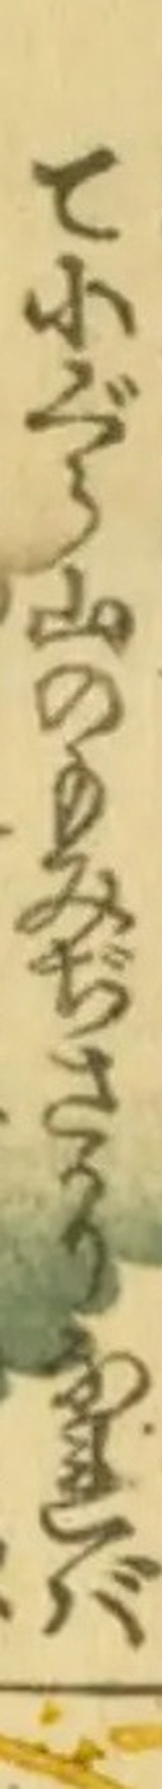て小ぐら山のもみぢさかりなれば
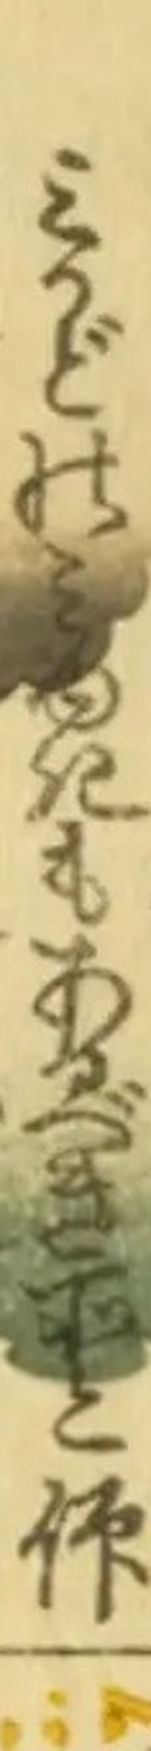みかどのみゆきもあるべきある所と仰
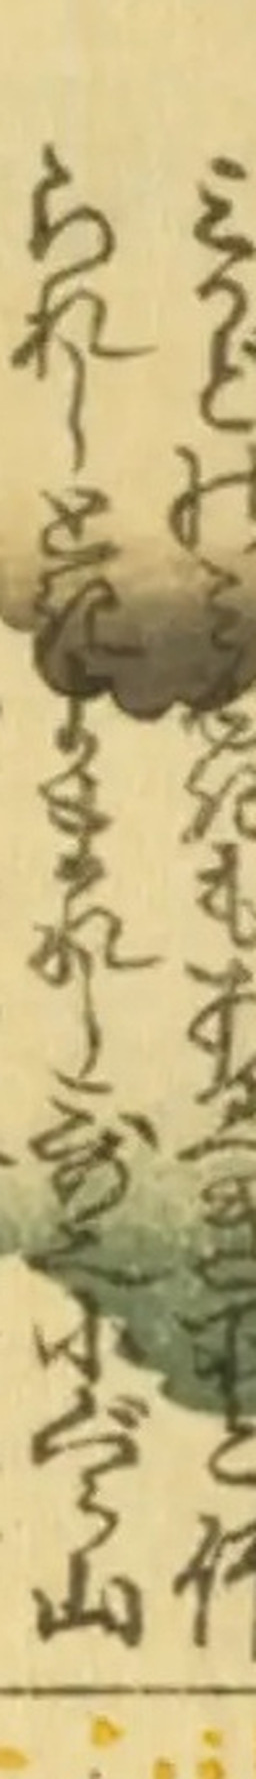られしときよまれし歌也小ぐら山
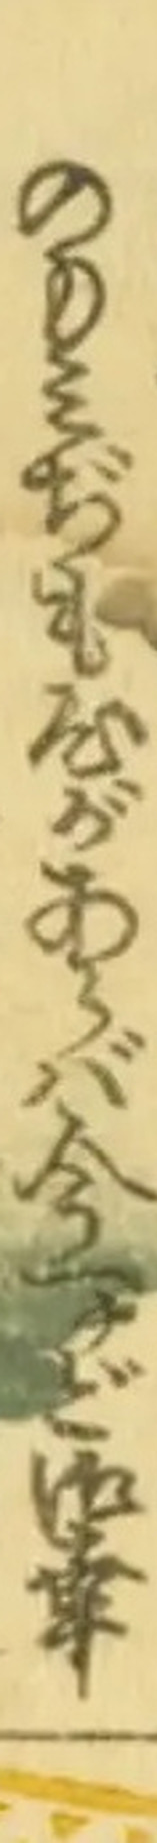のもみぢも心があらば今一チど御幸
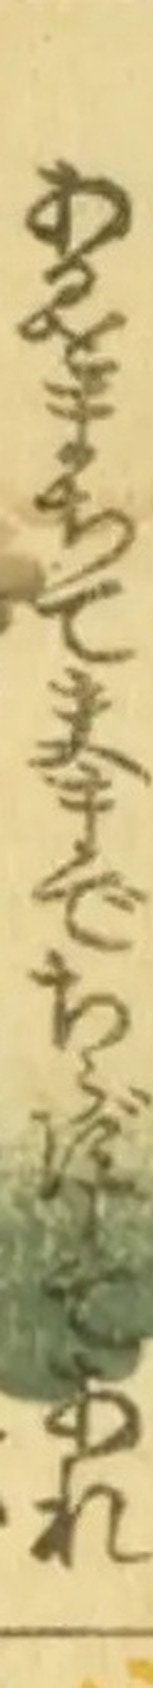あるをまちて夫までちらずしてあれ
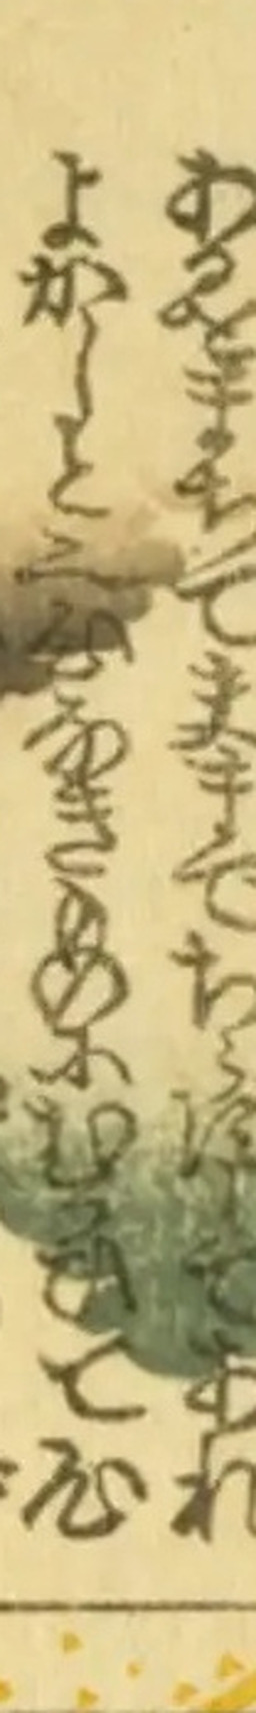よかしと也心なきものにむかひて心
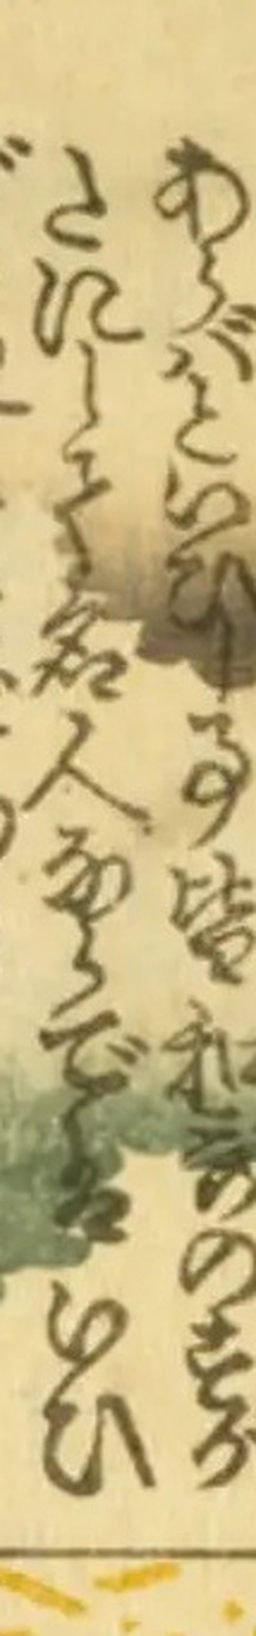たにして名人ならではいひ
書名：百人一首絵抄　廿六　貞信公
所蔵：国立国会図書館 National Diet Library, JAPAN
